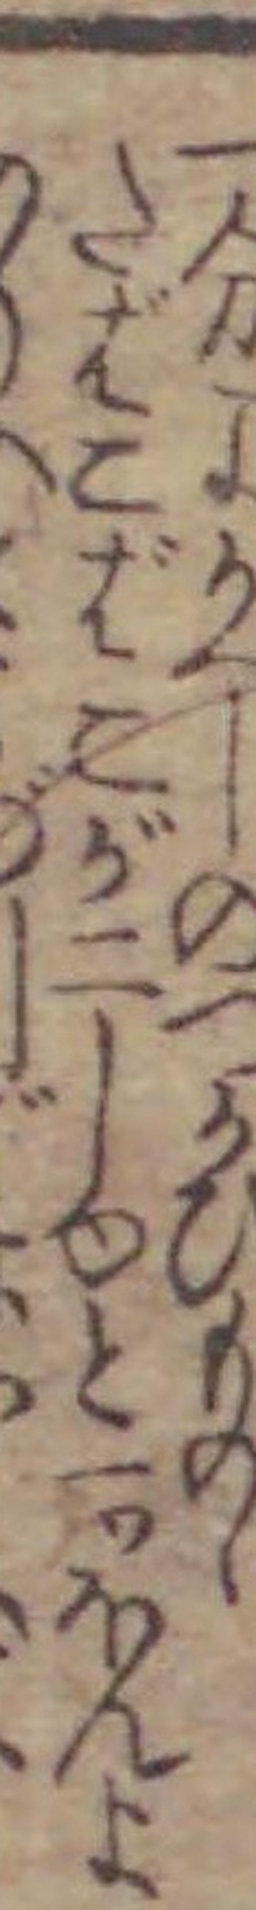たばこばこが二しゆと一ほんよ
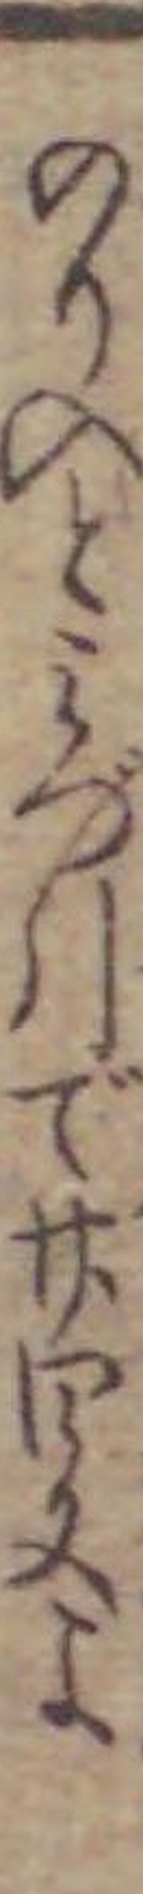のり入とみづ引で二十四文よ
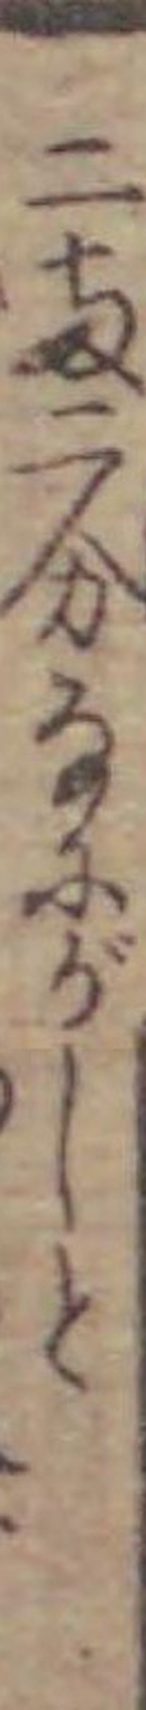二両二分なにがしと
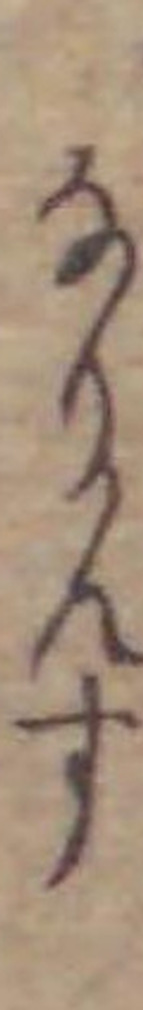なりんす
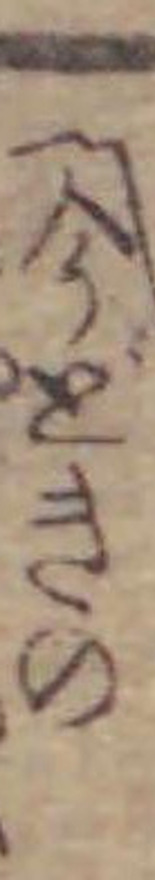「今どきの
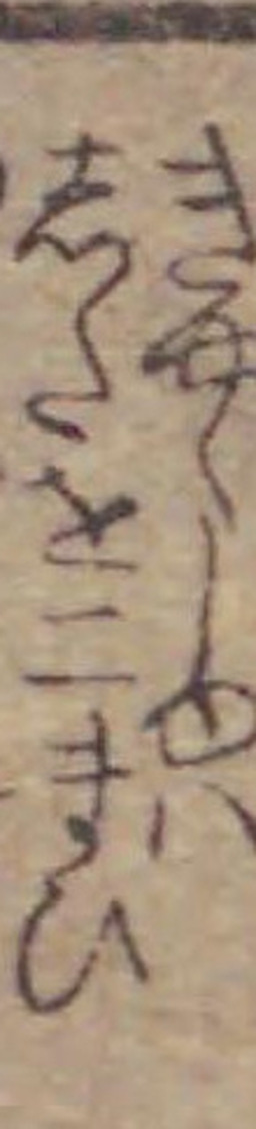したをこまひ
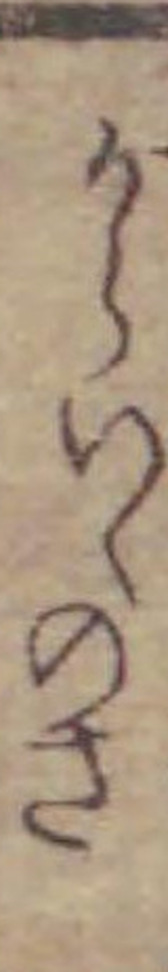からいゝのさ

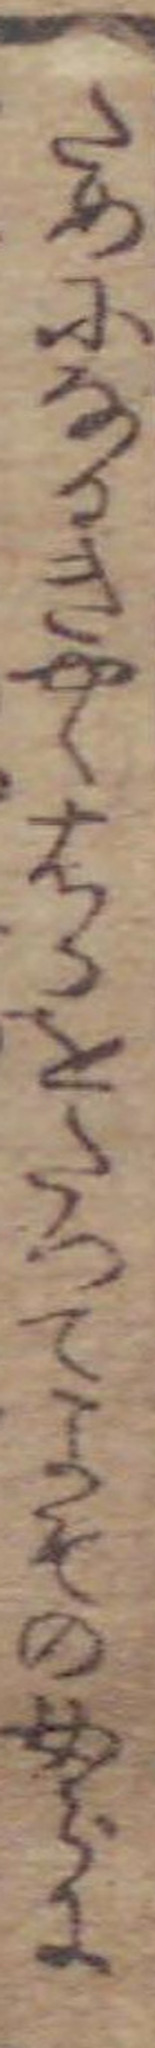ためになるきやくはらをたつてよその女郎に
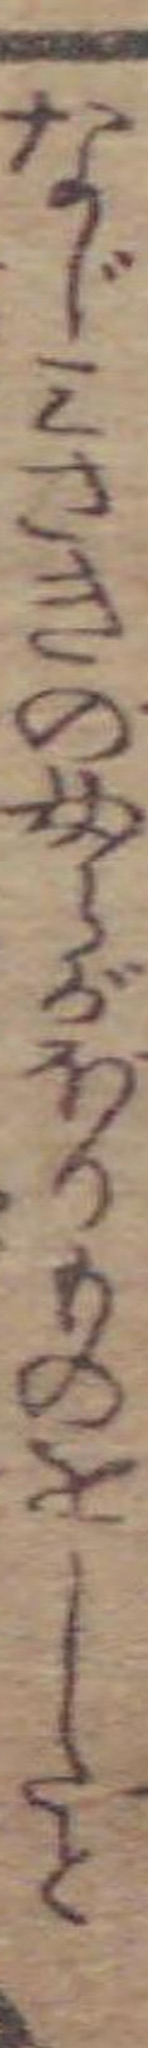なじみさきの女郎がほりものをしたと
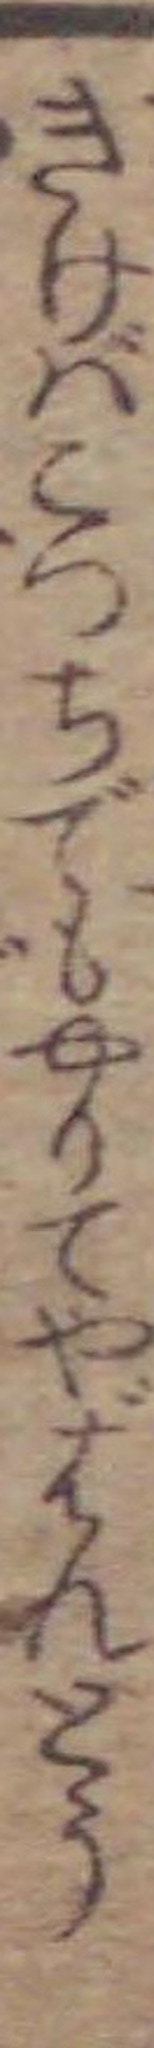きけばこつちでもやりてやばんとう
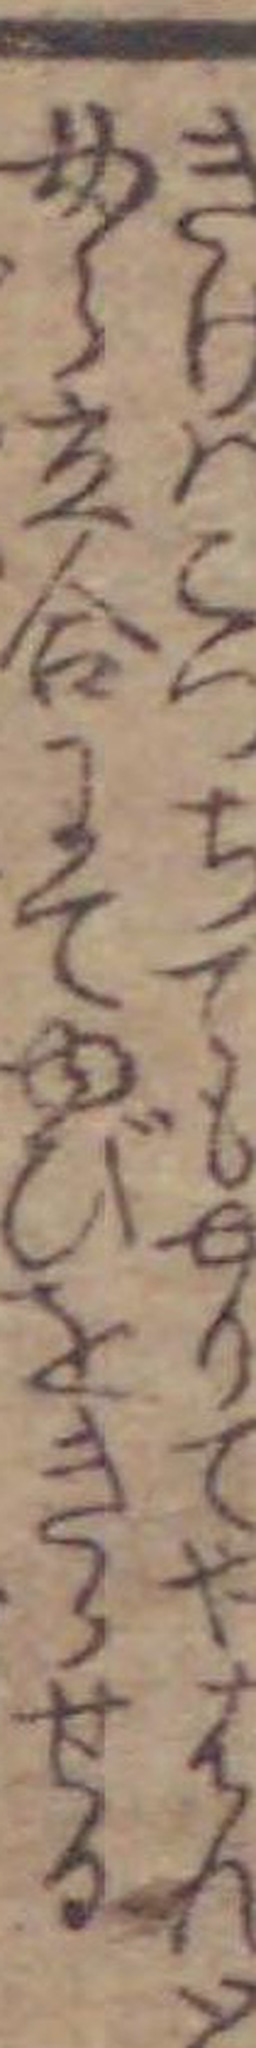女郎ら立合にてゆびをきらせる
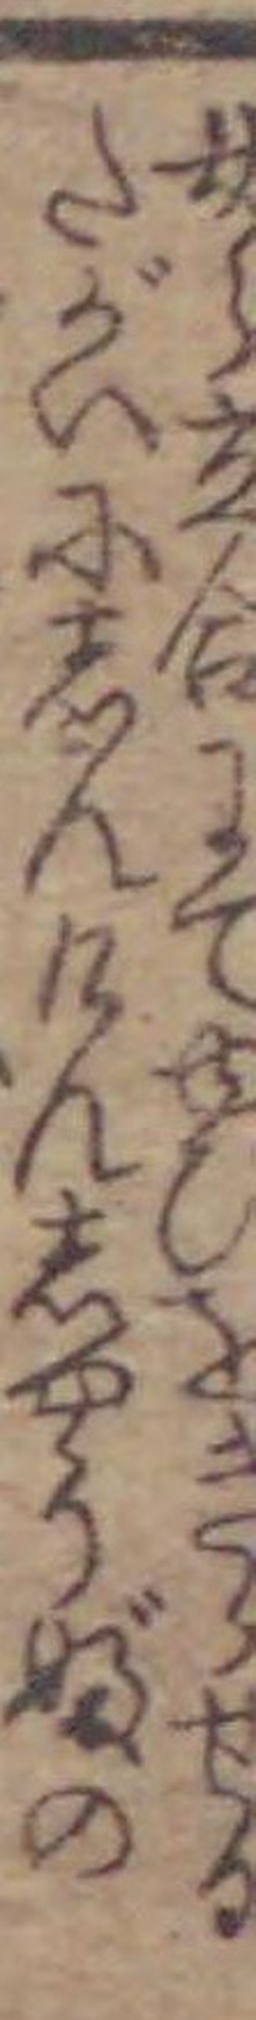たがいにしんけんしやうぶの
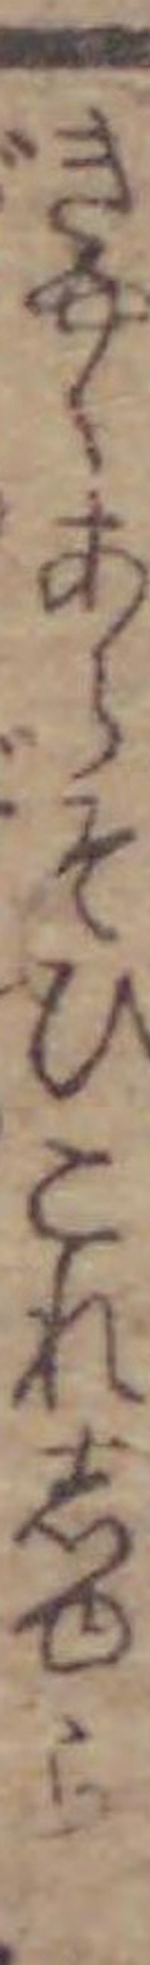きやくあらそひこれしゆら
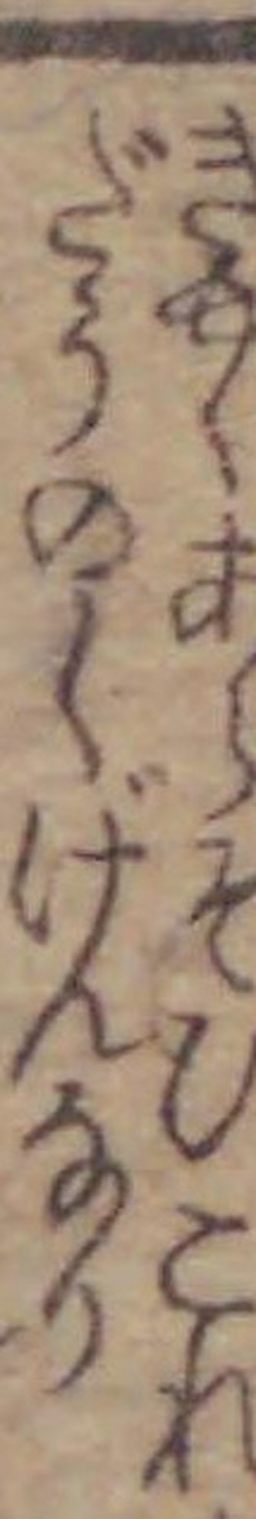だうのくげんなり
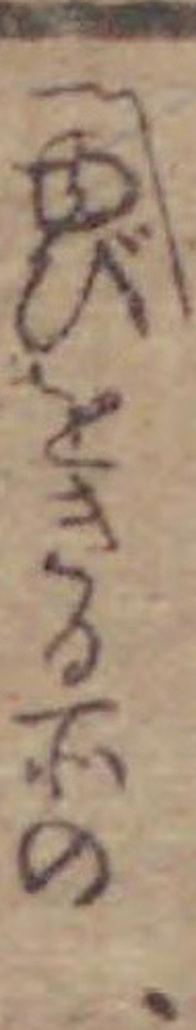「ゆびをきる所の
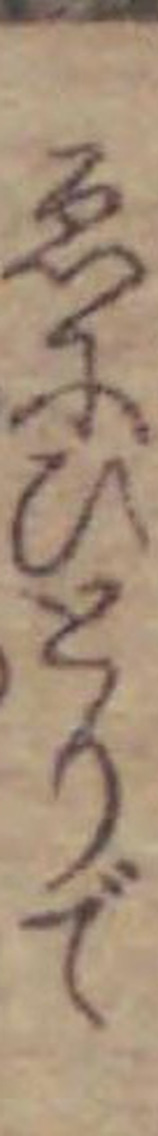ゑにひとりで
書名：九替十年色地獄 : 3巻
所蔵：国立国会図書館 National Diet Library, JAPAN
